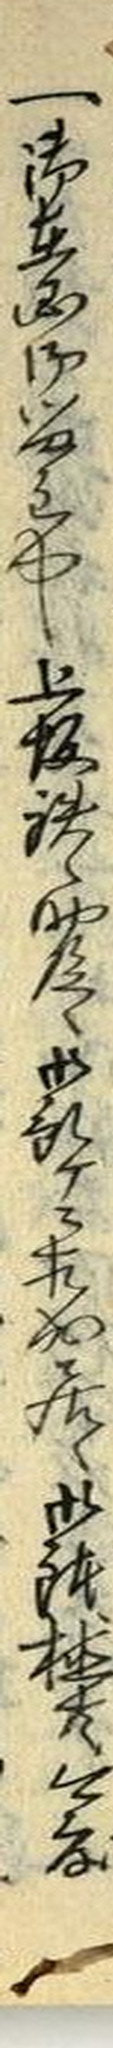一御在国御留守中上坂鉄之助殿へ御預ケニ相成居候御鉢植共今度
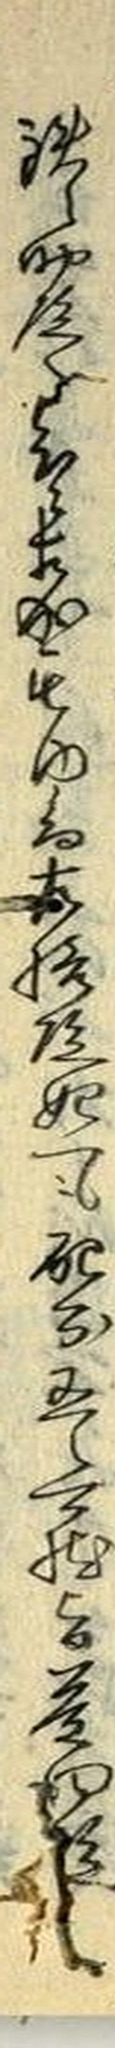鉄之助殿江被下ニ相成其内ニ而左膳殿始へも配分有之可然旨藤田殿
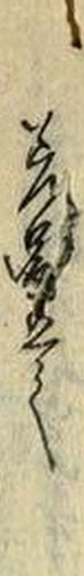差図有之
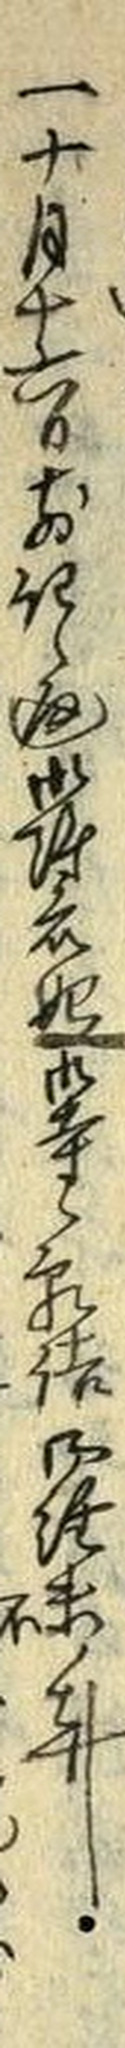一十月十六日前記之通御附衆始御寺へ願詰御経未ノ刻
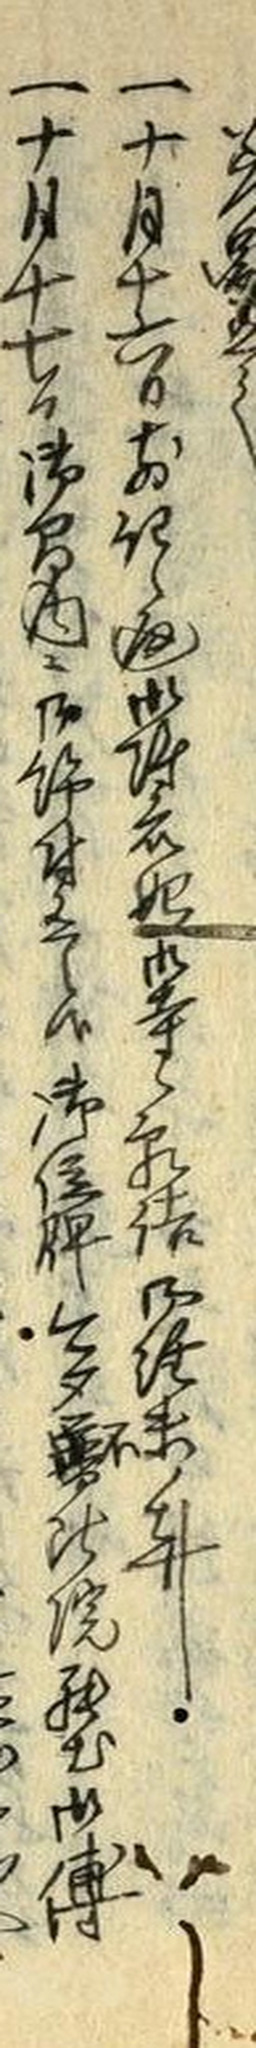一十月十七日御間内ニ御飾付有之候御位牌今夕不断院罷出御傅
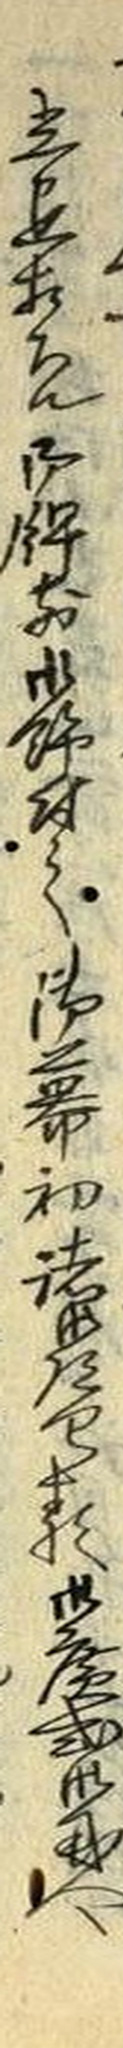立申上相下ル御牌前御飾付之御幕初諸御道具類御広式御用人
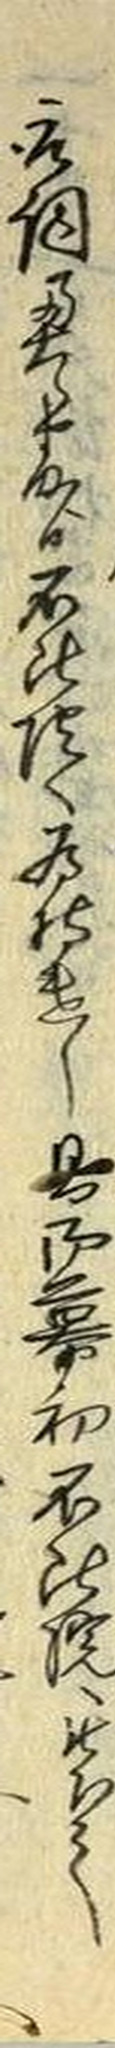取調奥之番ゟ不断院へ為持遣し即御幕初不断院へ被下之
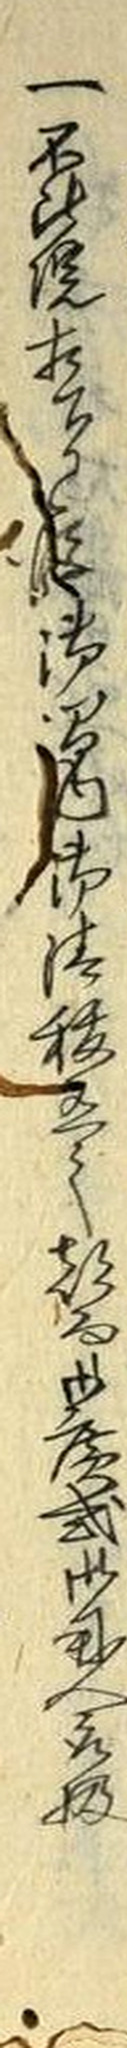一不断院相下り候段御間内御清祓有之都而御広式御用人取扱
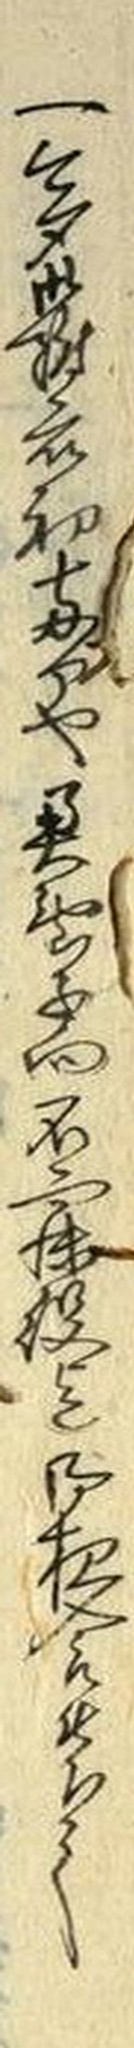一今夕御附衆初両部や奥台子向不寝役迄御夜食被下之
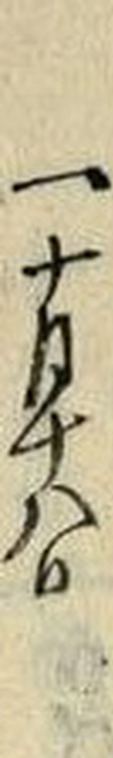一十月十八日
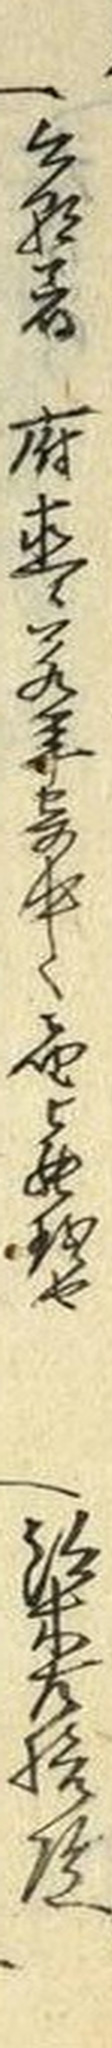今朝着府直々若年寄中へ届被罷越由鈴木左膳殿
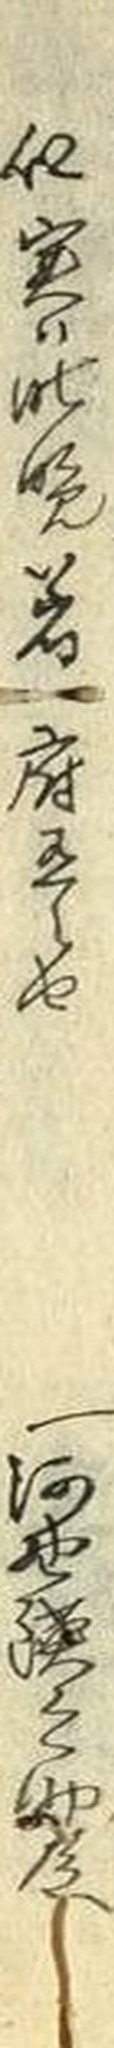但実ハ昨晩着府有之由河野鍈之助殿
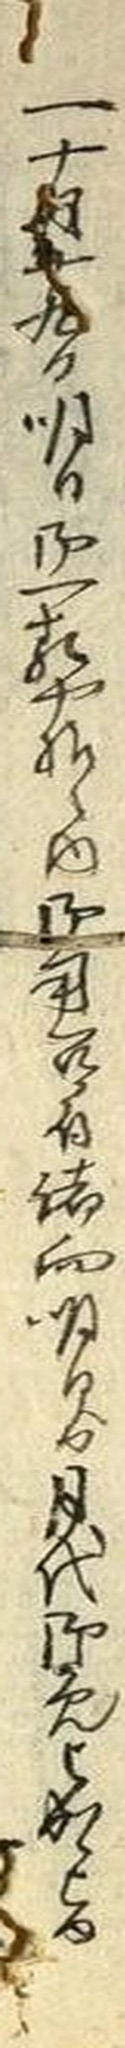一十月十九日明日御一類中様之内御用召候ニ付諸向明日ゟ月代御免被成候旨
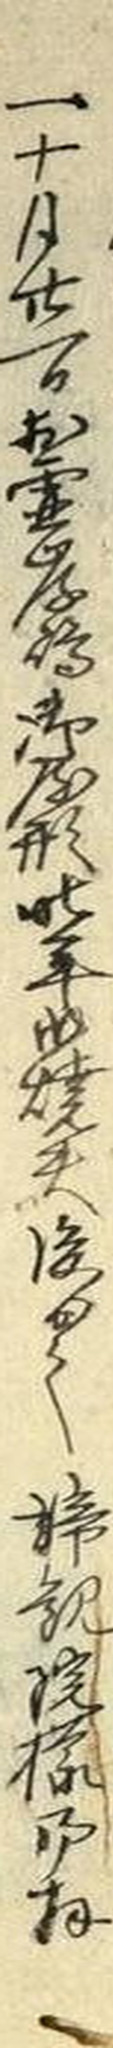一十月廿一日於霊岸嶋御屋形昨年御焼失後ゟ之諦観院様御拝
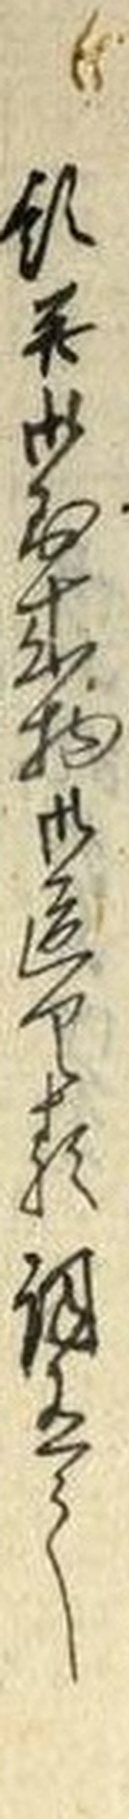領并御到来物御道具類調有之
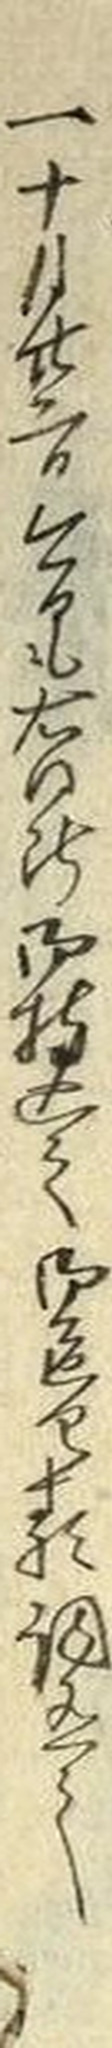一十月廿二日今日も右同断御持込之御道具類調有之
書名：少傅日録抄（斉善付側向頭取日記、江戸并道中、初入在国、逝去後…
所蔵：福井県文書館 Fukui Prefectural Archives
